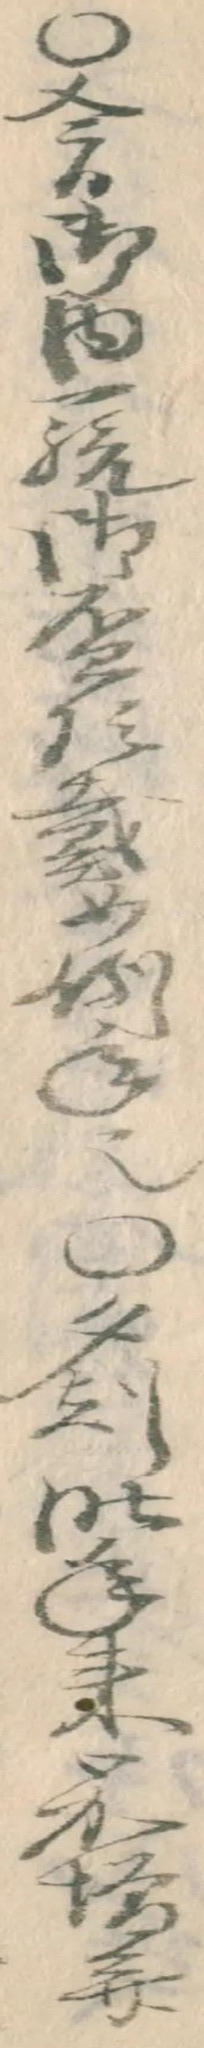○今日御内一統御盃頂戴如例年也○夕刻昨年来御加増幷
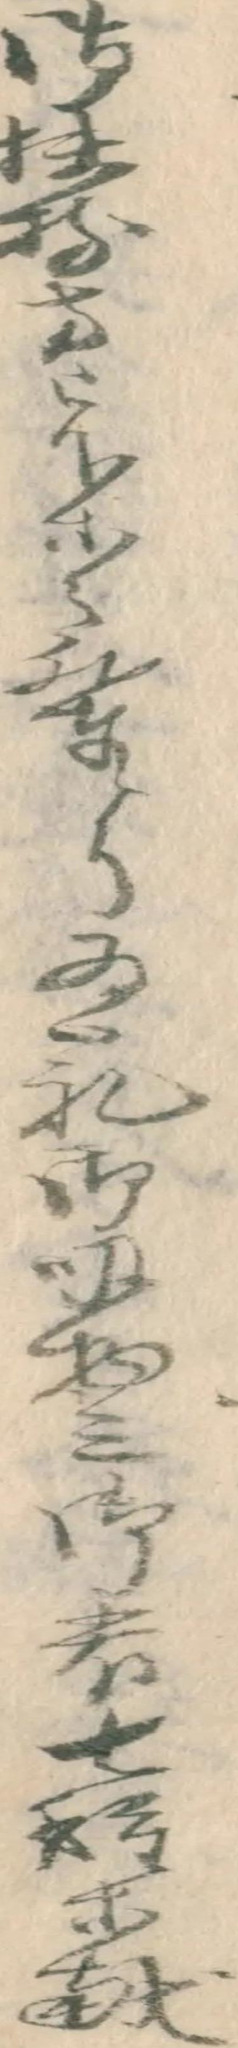御扶持方被下等御奉行為御礼御吸物三御肴七種等献
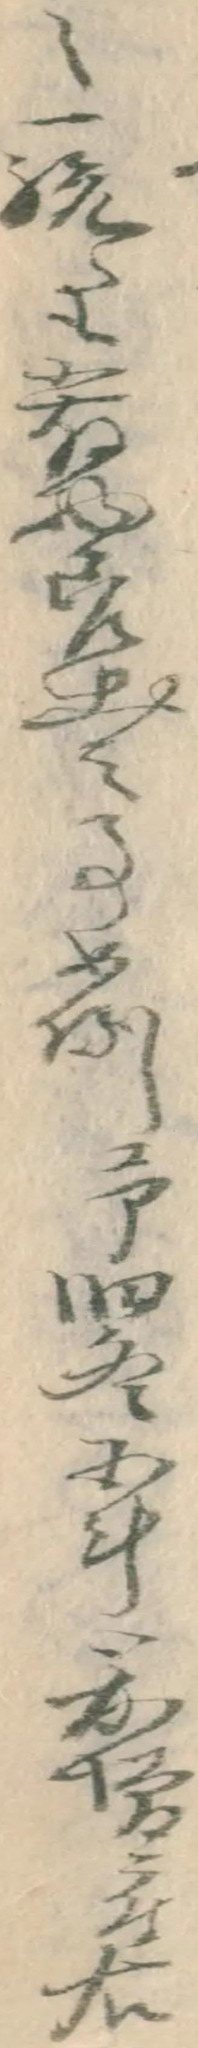之一統へも肴物差出之事如例予旧冬五斗御加増ニ付右

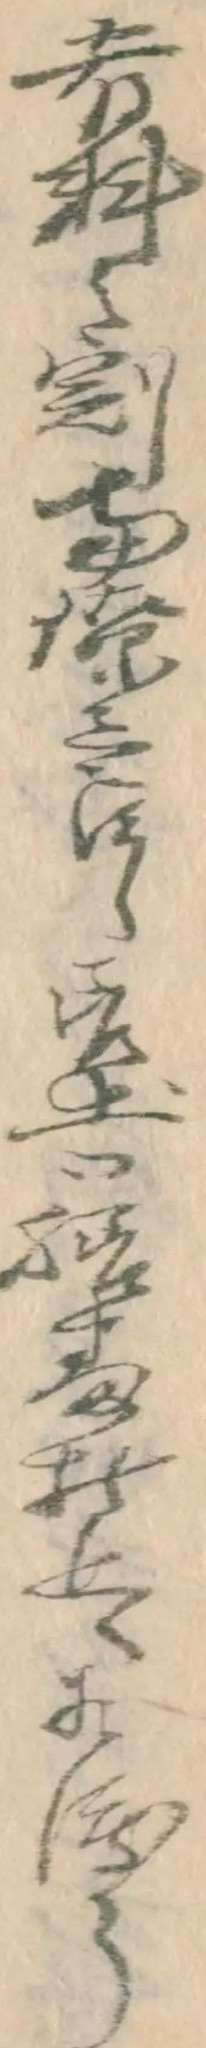肴料之割南鐐壱片差出御膳番村上へ相渡了
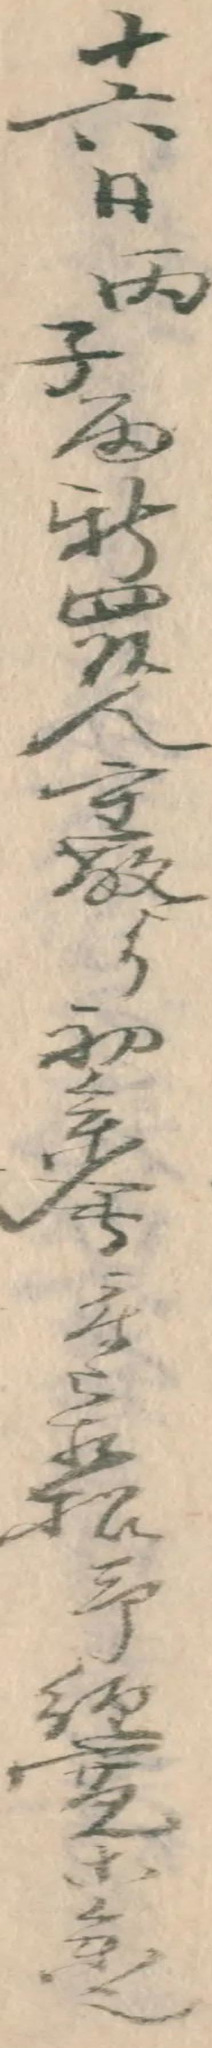十六日丙子雨新四頭人重敬より初参會ニ付被相招予経寛等参也
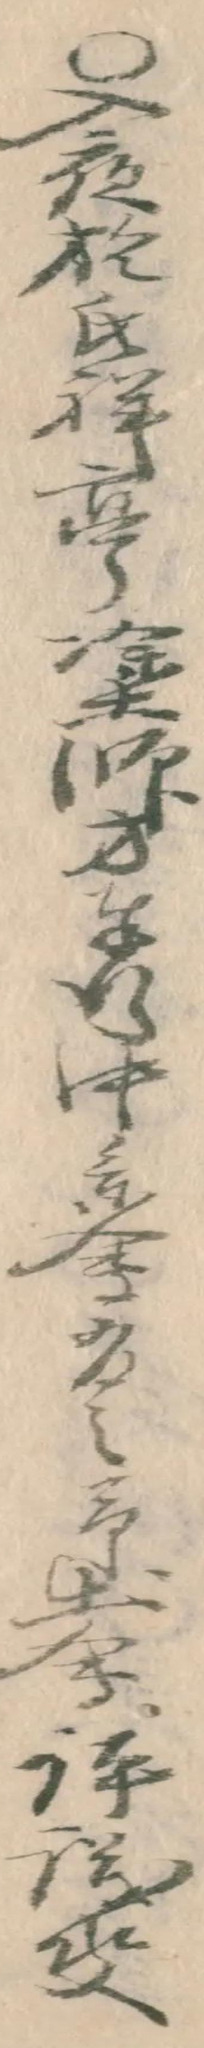○入夜於氏祥亭塗師方奉行中参會有之予出會評議決
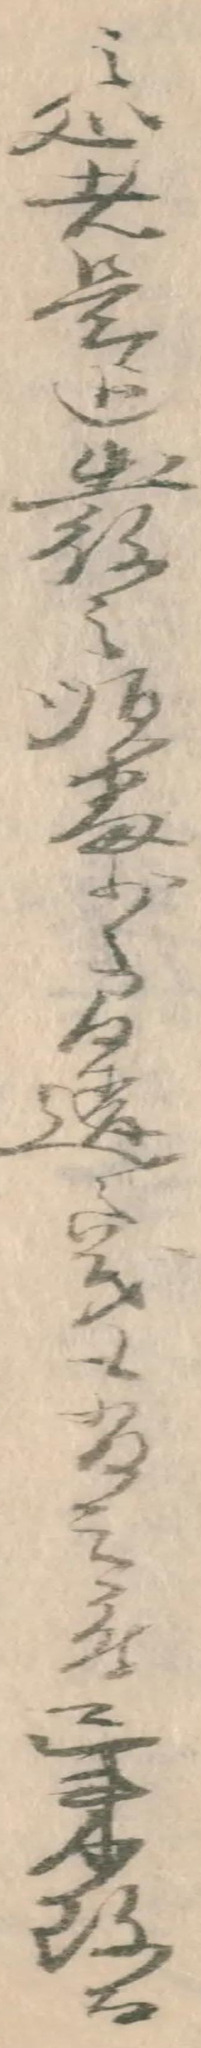之処者是迄出役之順番少々間違之義も有之ニ付已来改而
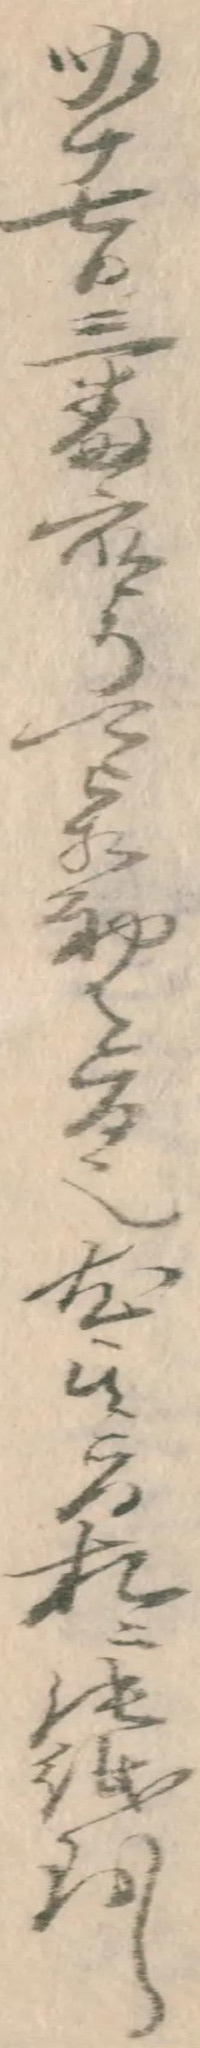明十七日三番衆より可被相勤候旨也尤其旨札ニ張紙致し
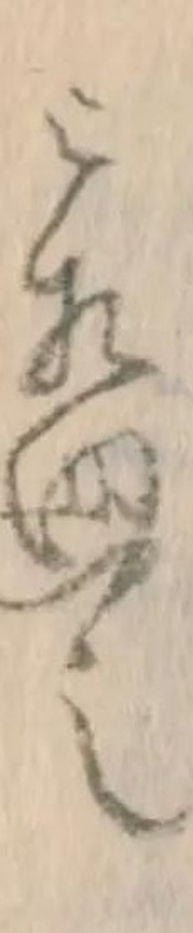被相廻也
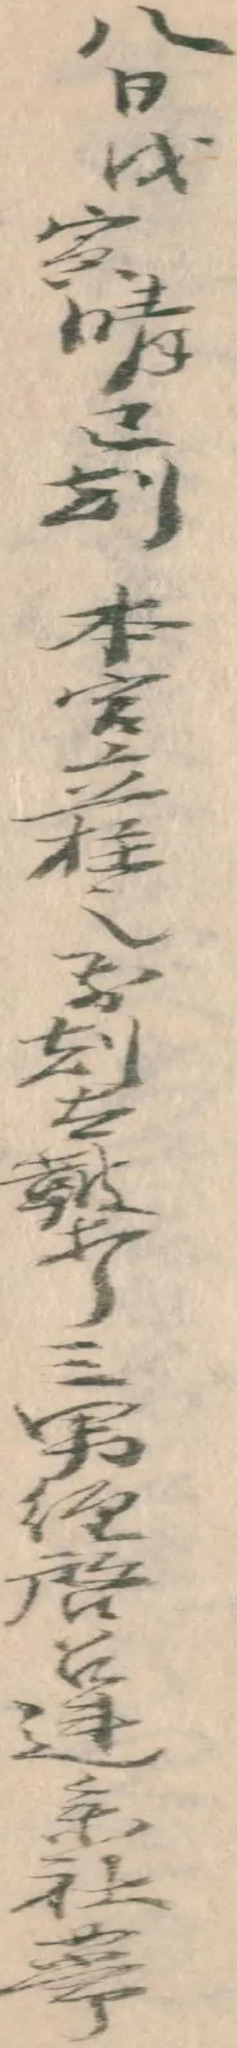十八日戊寅晴巳刻本宮立柱之前刻太皷打三男経啓召連参社如常
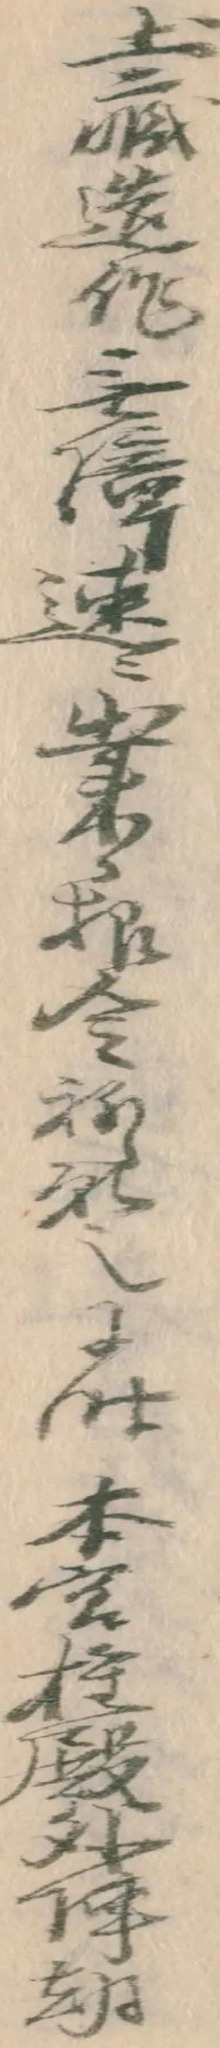土蔵造作無障速ニ出来候様令祈候也于時本宮権殿外陣朝
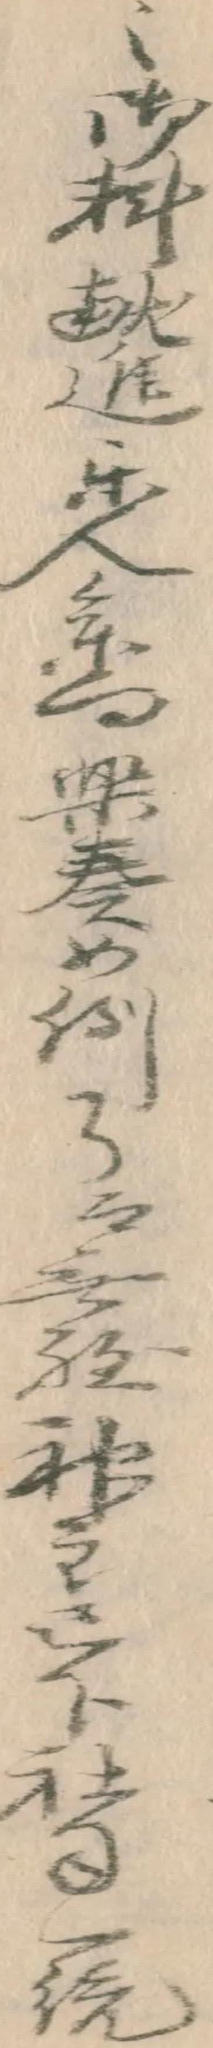之御料献進楽人参向楽奏如例了而無程神主已下社司一統
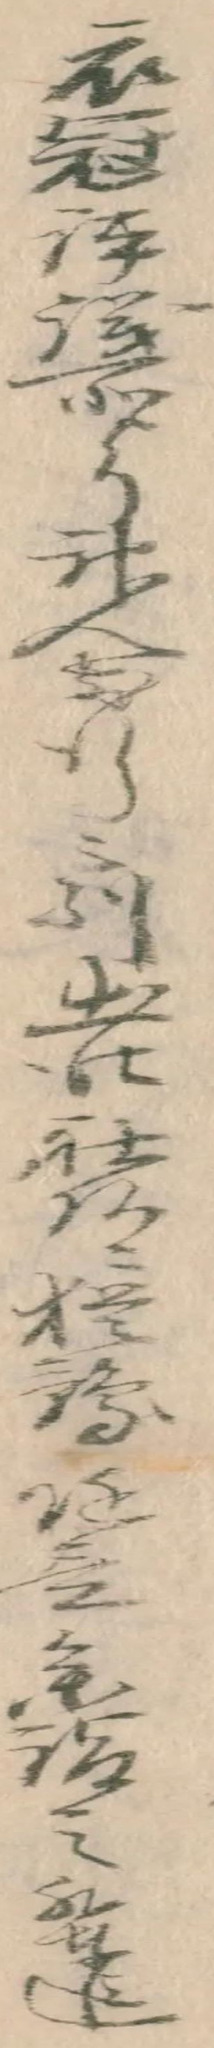衣冠評議所より神人奉行之列出仕社頭に猶豫随意参詣之輩遅
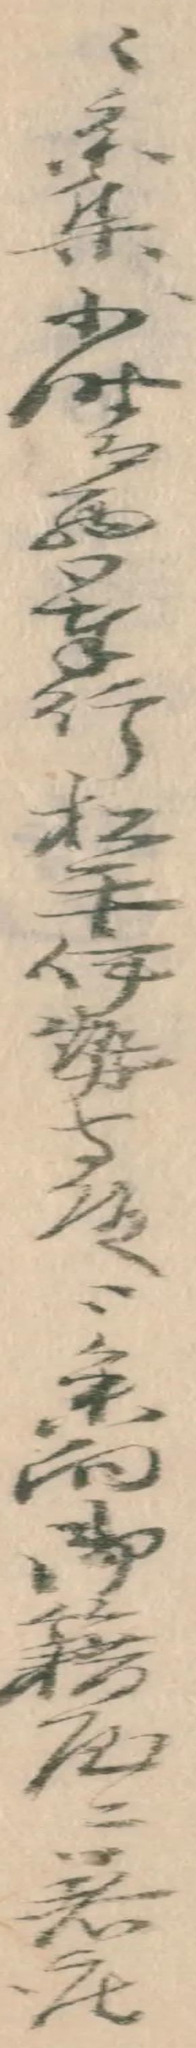々参集小時而西御奉行松平伊勢守殿御参向御籍屋ニ着座
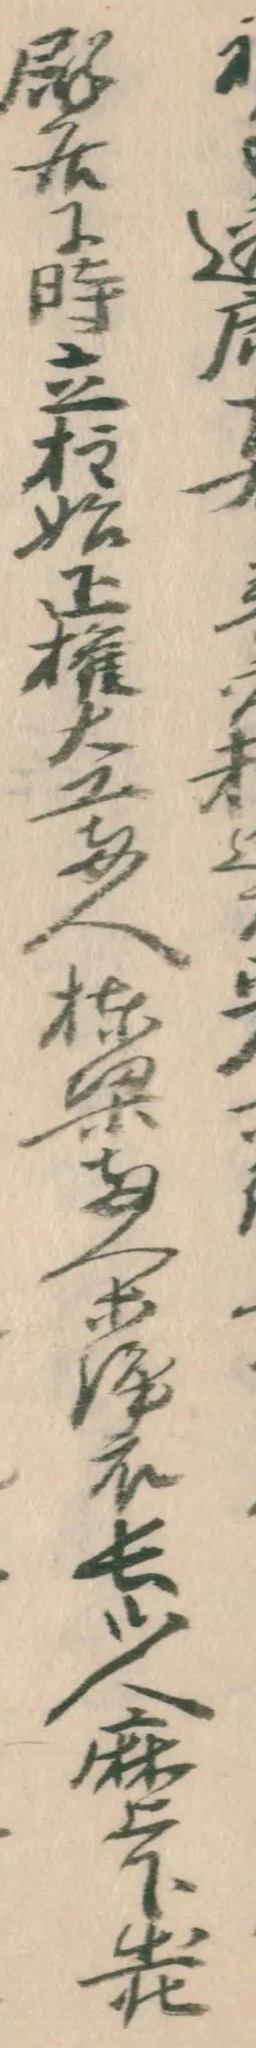群居于時立柱始正権大工両人棟梁両人等浄衣長弐人麻上下出仕
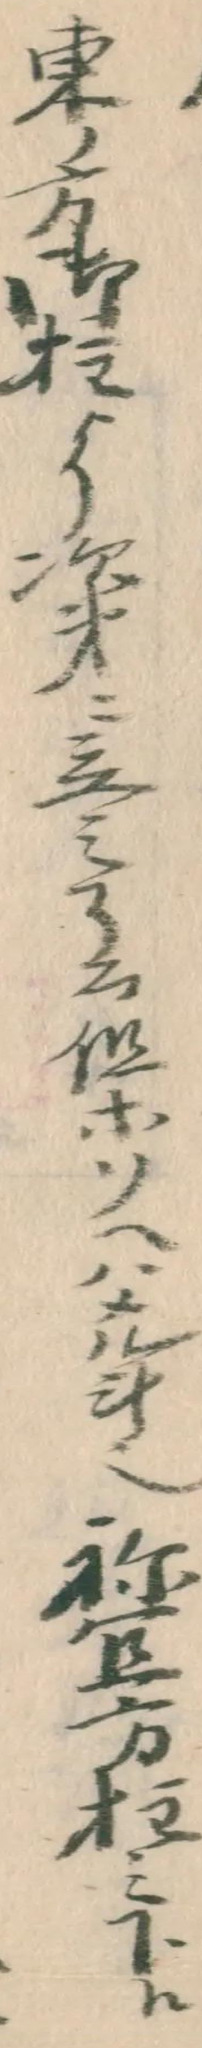東ノ方御柱より次第ニ立之了而但ホソヘハメル斗也称宜方柱之下え
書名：賀茂社記録. 第67冊
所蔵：国立国会図書館 National Diet Library, JAPAN
